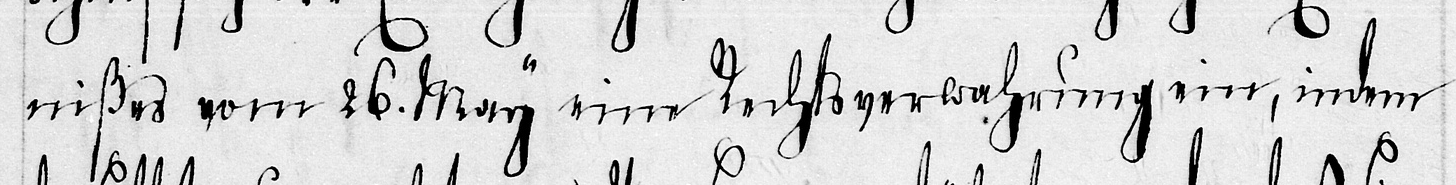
tnißes vom 26. May eine Rechtverwahrung ein, indem
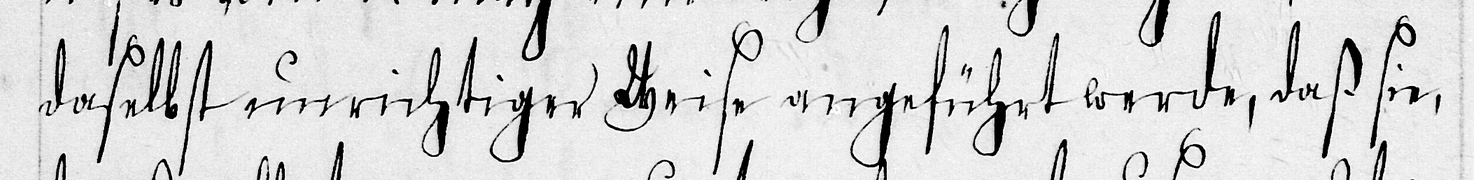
daselbst unrichtiger Weise angeführt werde, daß sie,
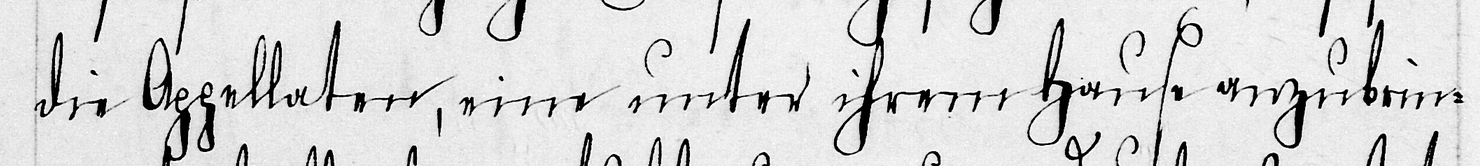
die Appellaten, eine unter ihrem Hause anzubrin¬
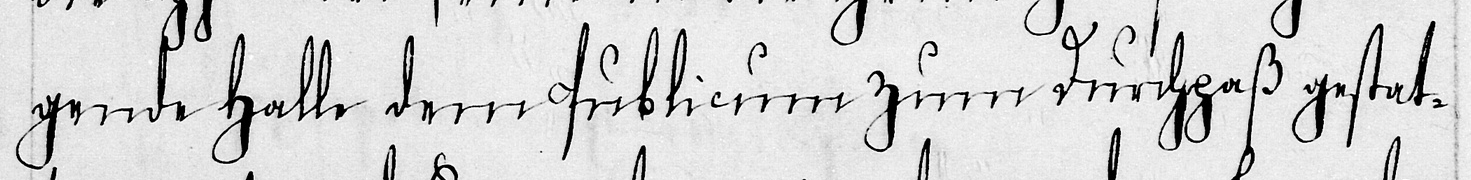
gende Halle dem Publicum zum Durchpaß gestat¬
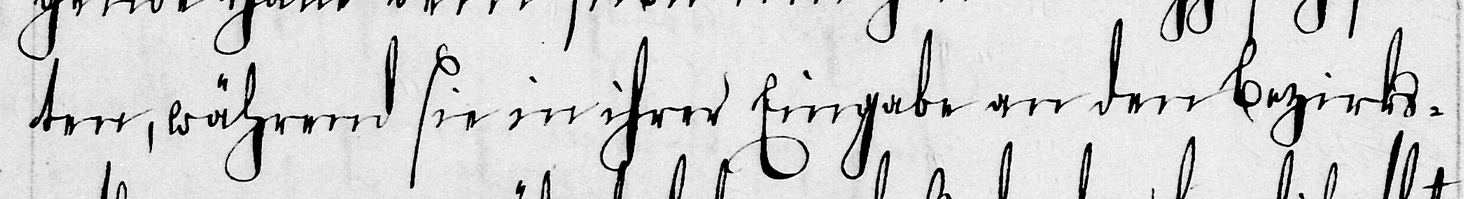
ten, während sie in ihrer Eingabe an den Bezirks¬
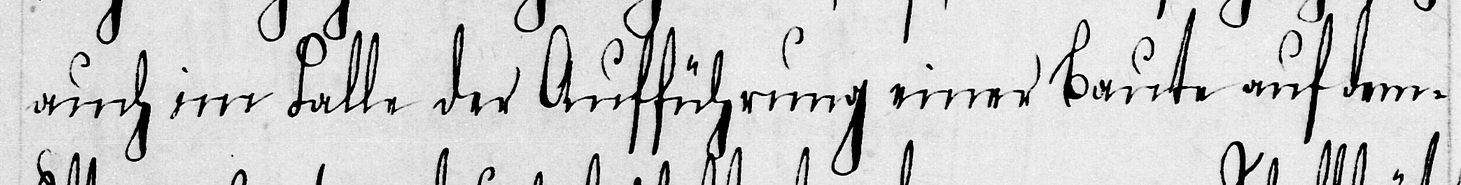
auch im Falle der Aufführung einer Baute auf dem¬
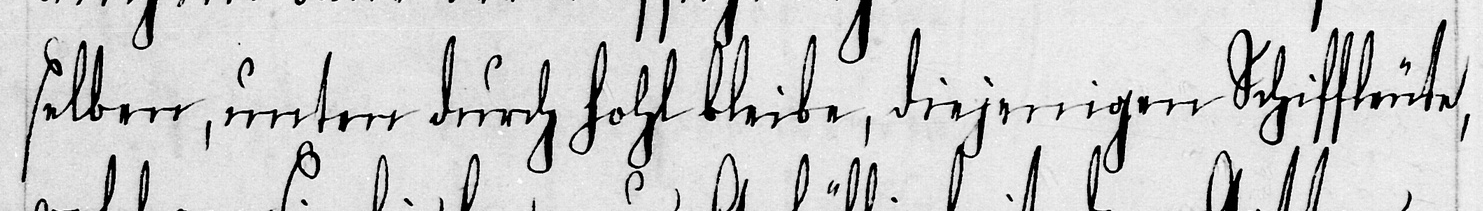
selben, unten durch hohl bleibe, diejenigen Schiffleut¬
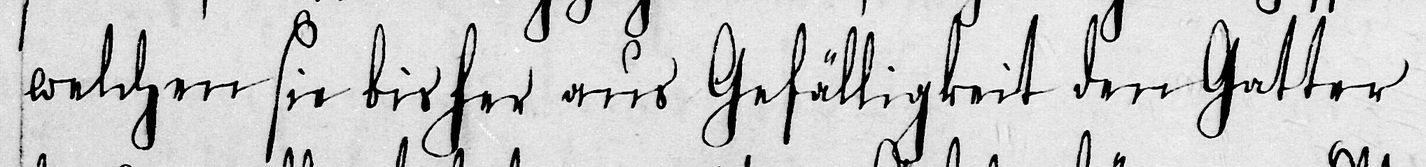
welchen sie bisher aus Gefälligkeit den Gatter
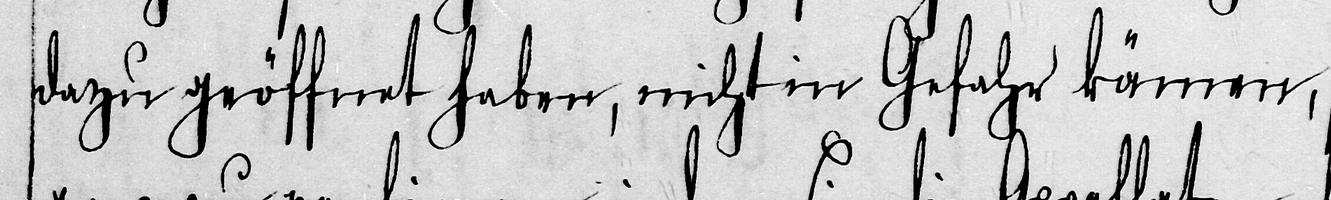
dazu geöffnet haben, nicht in Gefahr kämen,
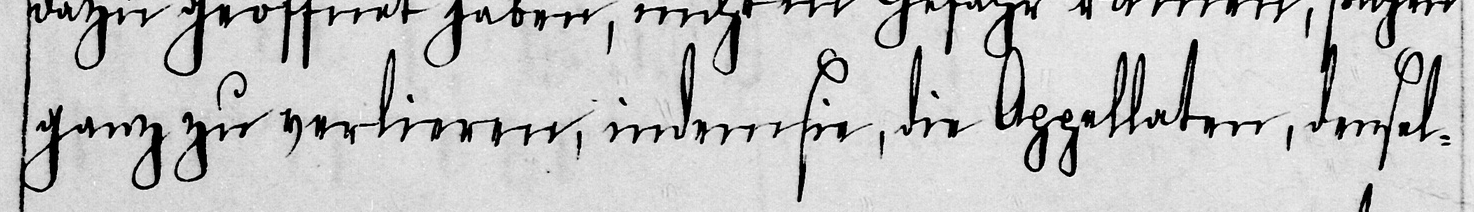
ganz zu verlieren, indem sie, die Appellaten, densel-
